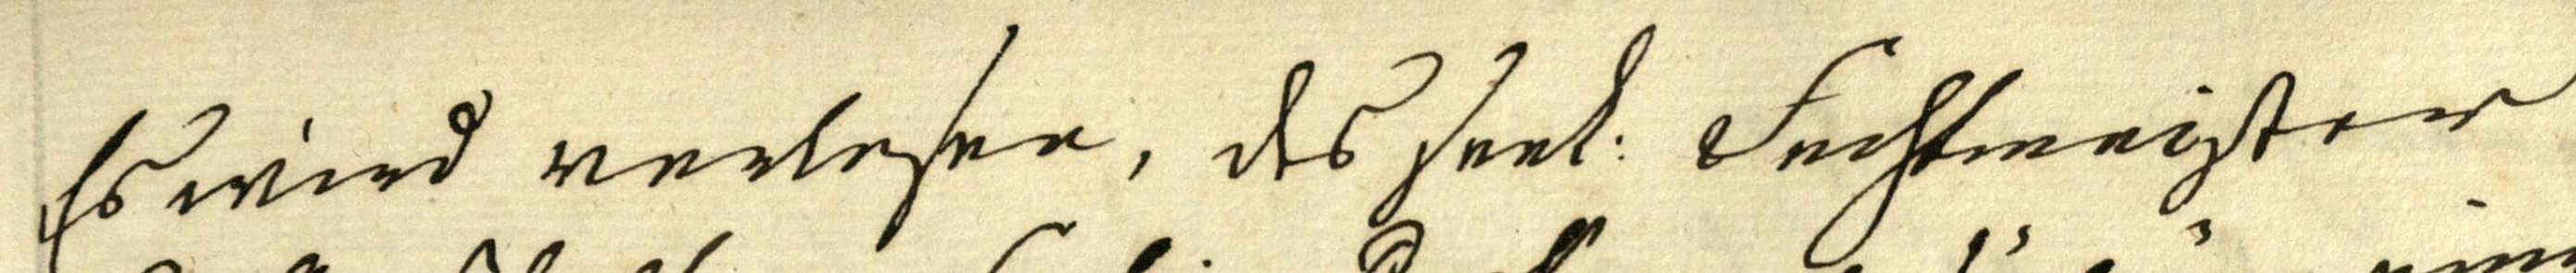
Es wird verlesen, des seel. Fechtmeister
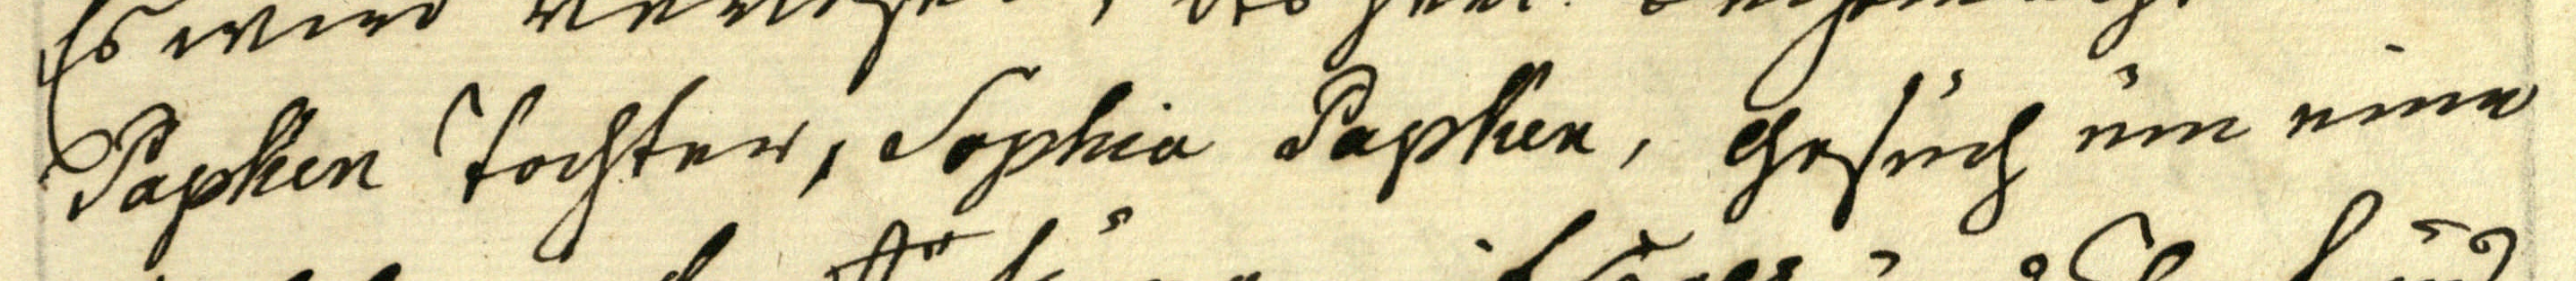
Papken Tochter, Sophia Papken, Gesuch um eine
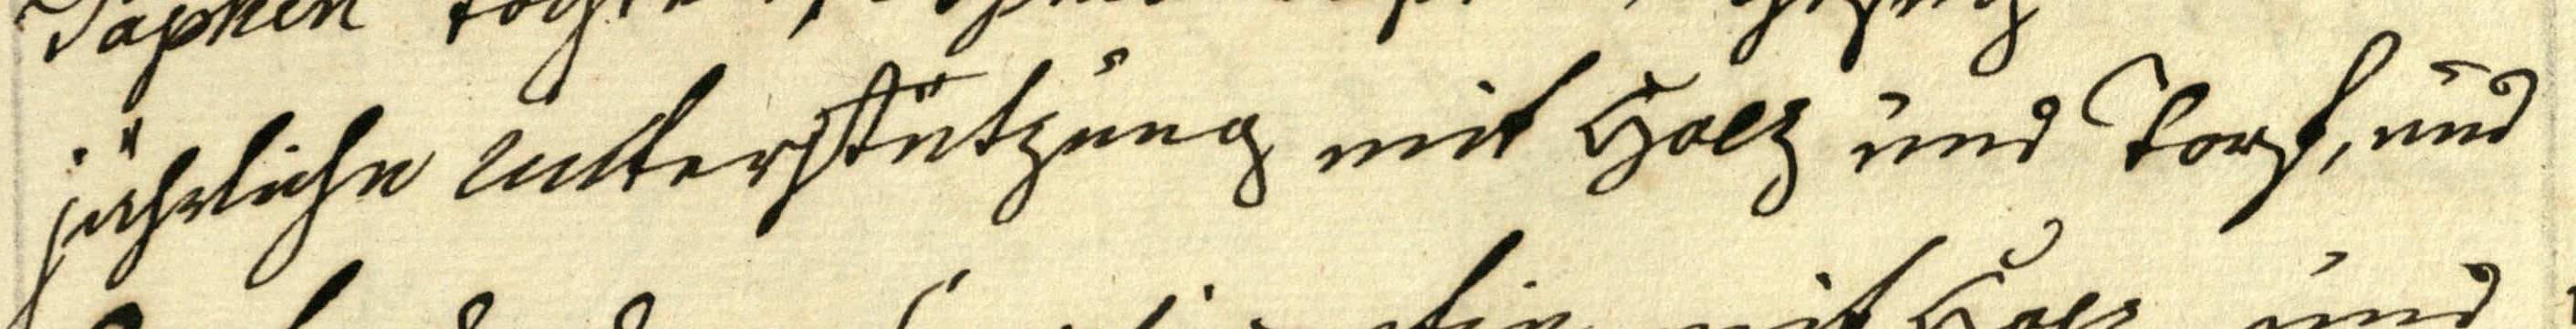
jährliche Unterstützung mit Holz und Torf, und
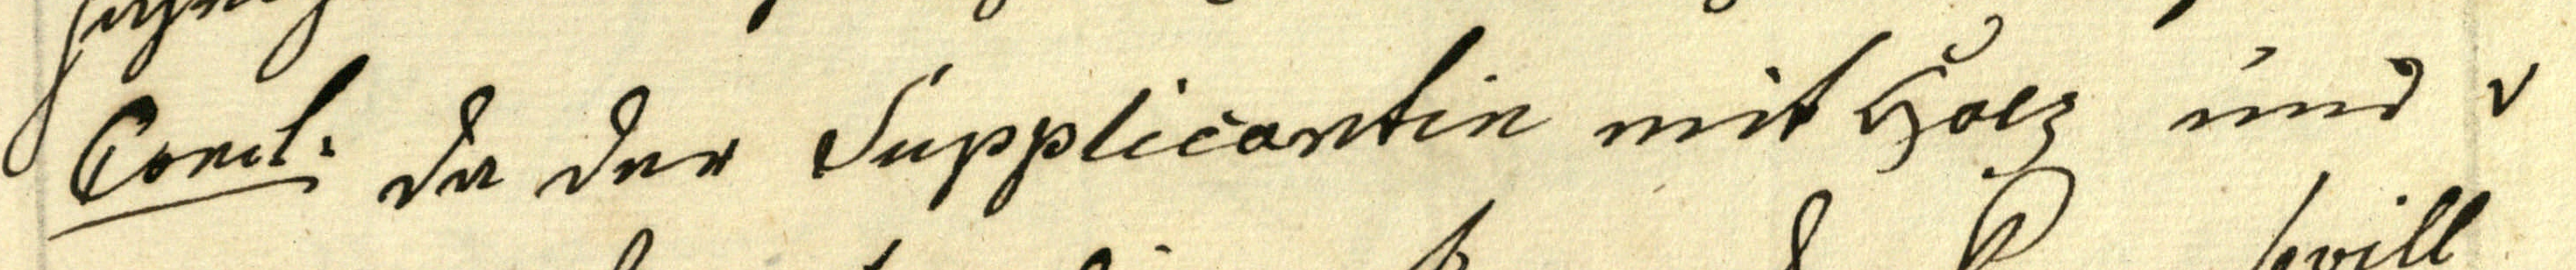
Concl. da der Supplicantin mit Holz und
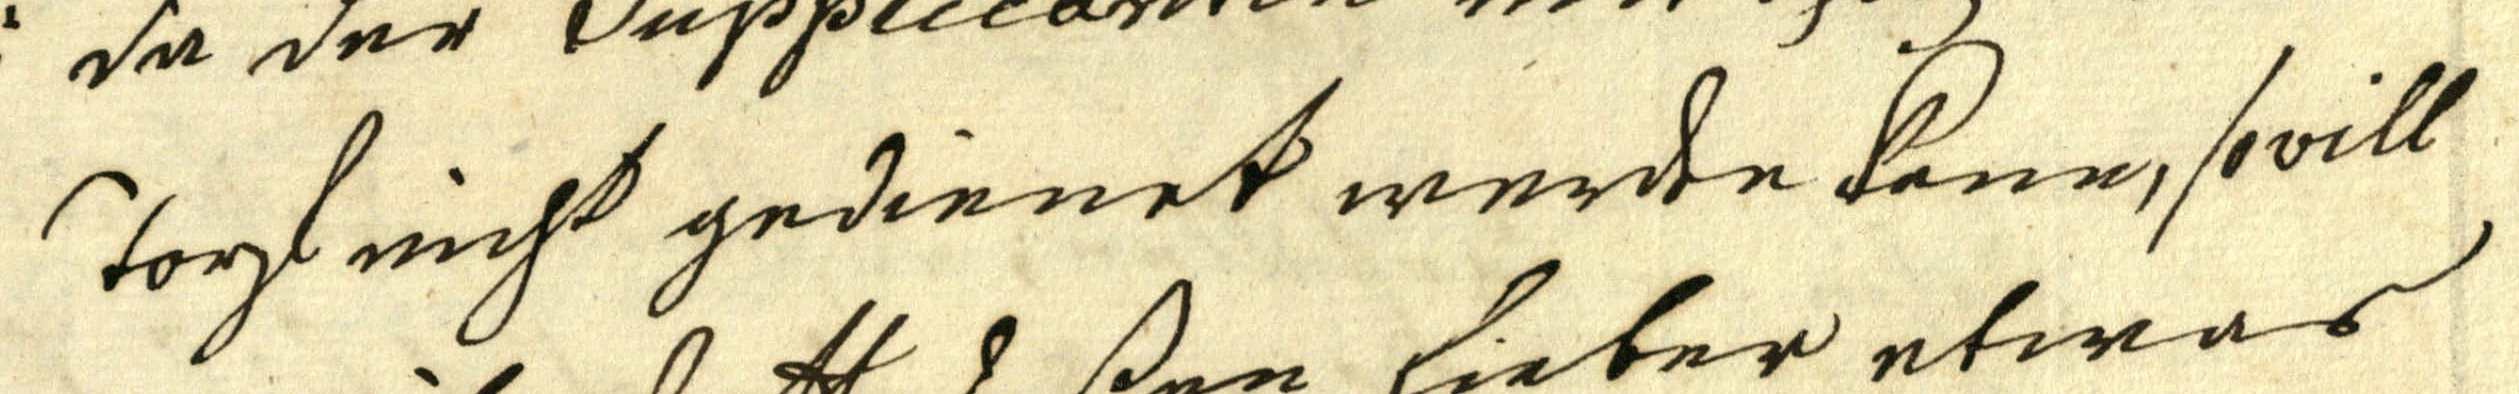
Torf nicht gedienet werden kann, soll
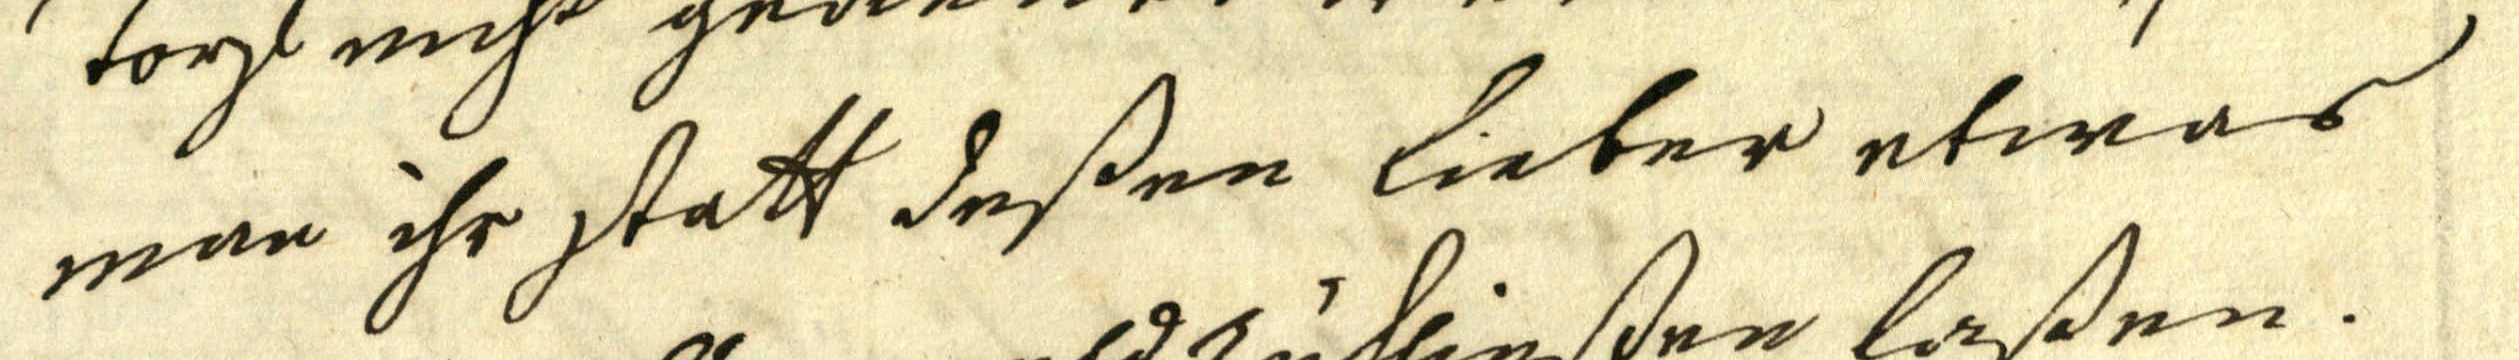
man ihr statt deßen lieber etwas
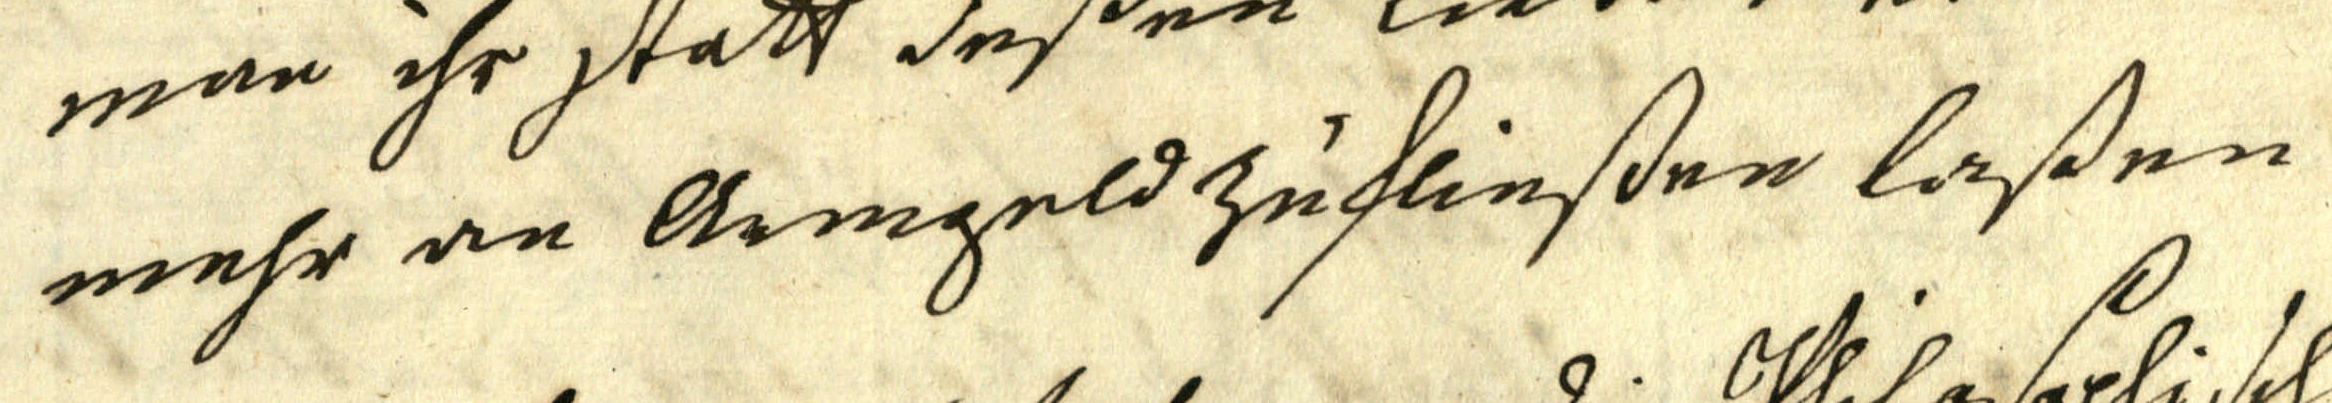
mehr an Armgeld zufließen laßen.
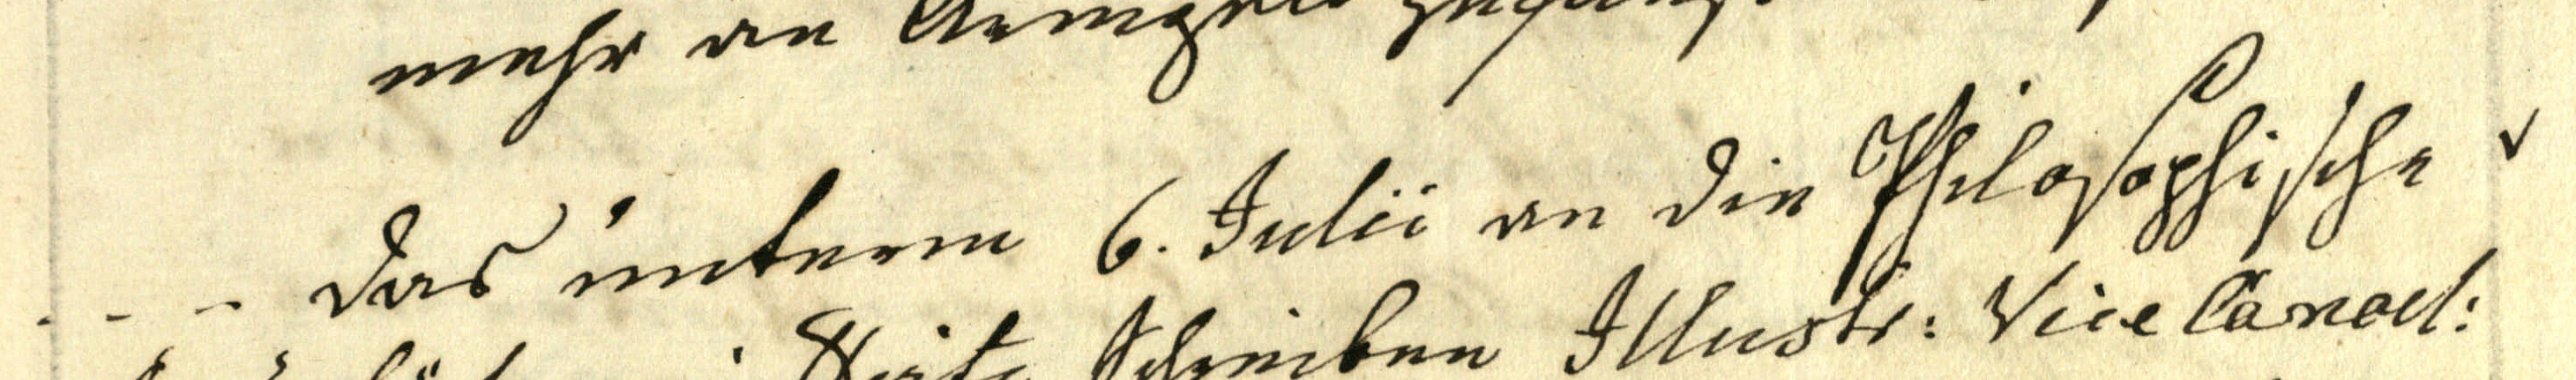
Das unterm 6. Julii an die Philosophische
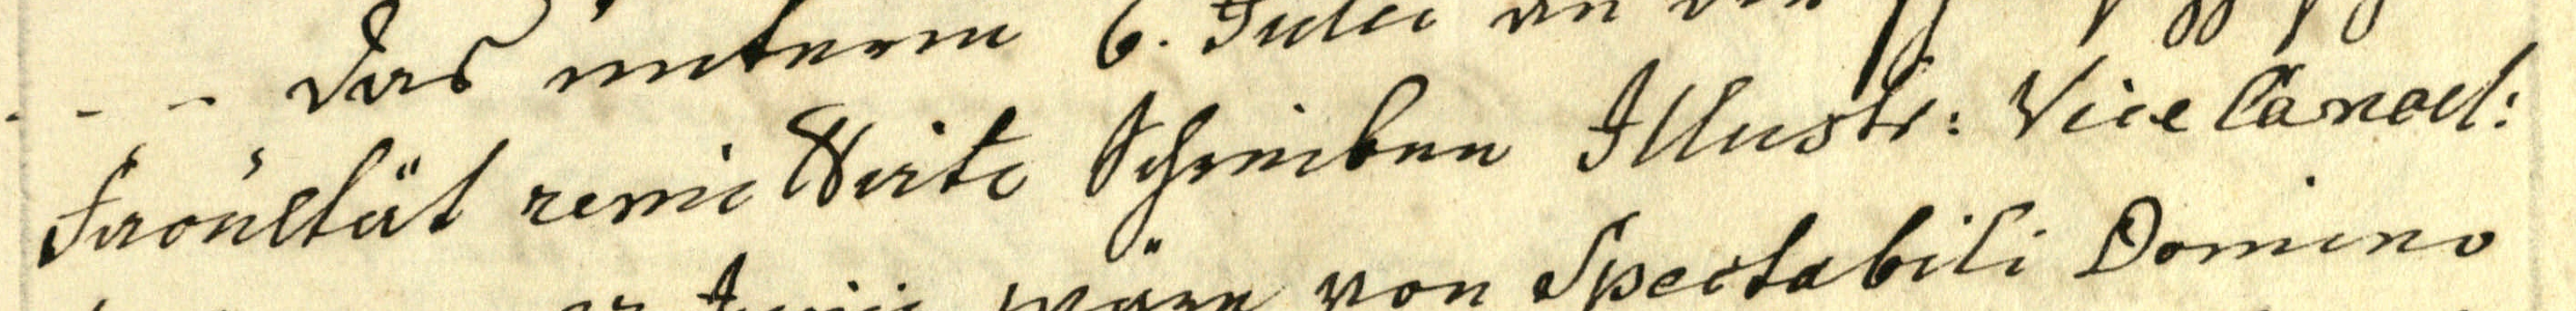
Facultät remittirte Schreiben Illustr. Vice Cancel¬
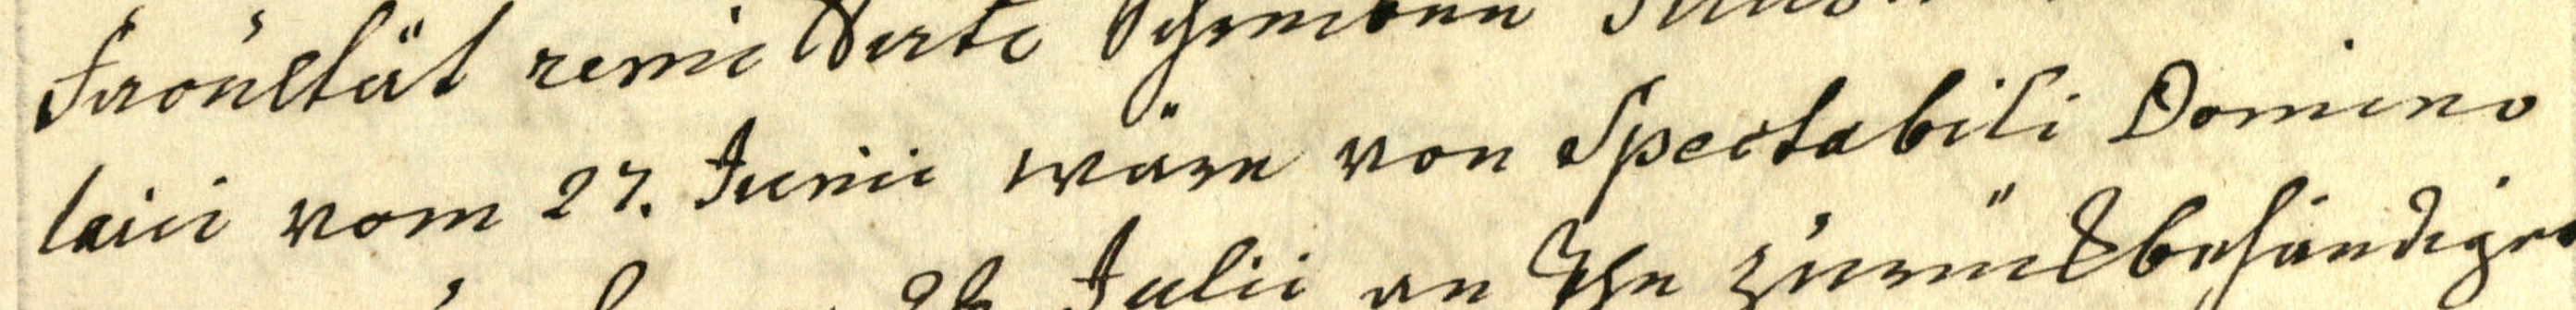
larii vom 27. Junii wäre von Spectabili Domino
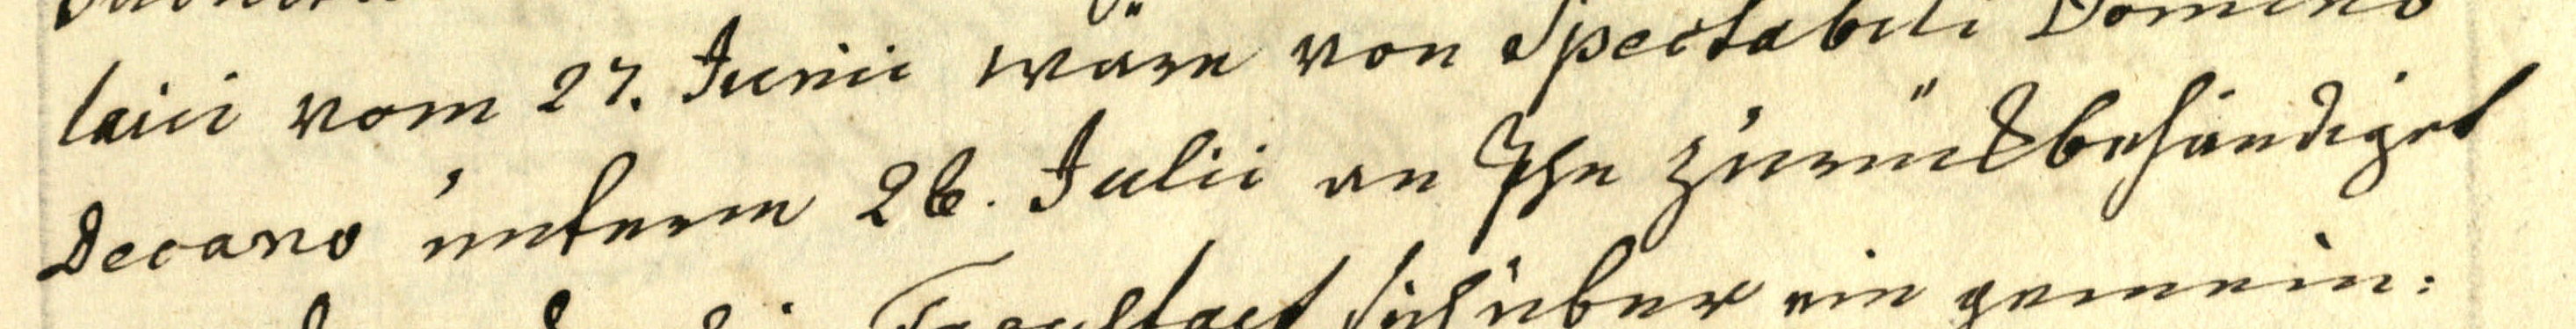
Decano unterm 26. Julii an Ihn zurückbehändiget
